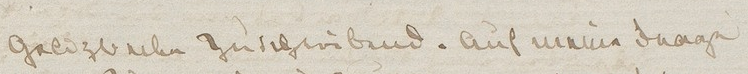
Geldzwecke zuschreibend. Auf meine Frage
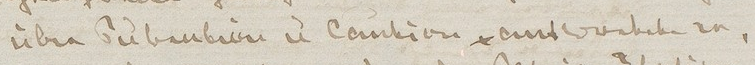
über Subention u Caution antwortete er,
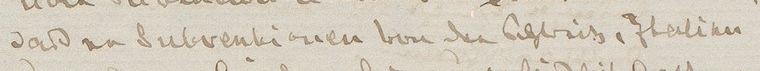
daß er Subventionen von der Schweiz, Italien
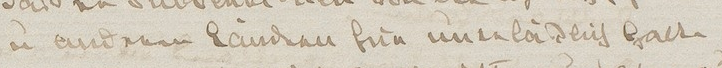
u anderen Ländern für unerläßlich halte,
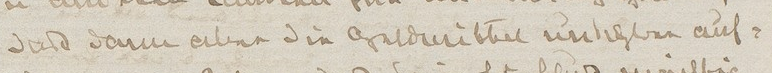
daß dann aber die Geldmittel unschwer auf-
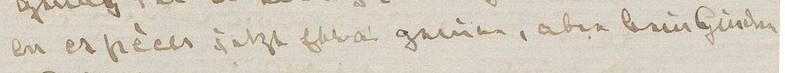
en espèces jetzt Etwas genire, aber kein Hinder-
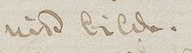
niß bilde.
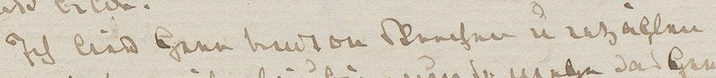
Ich ließ Herr Hudson sprechen u erzählen,
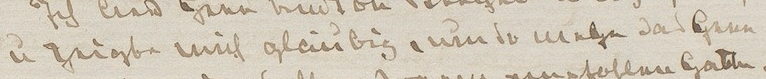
u zeigte mich gläubig, umso mehr das Herr
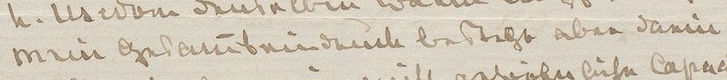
Mein Gesammteindruck besteht aber darin,
